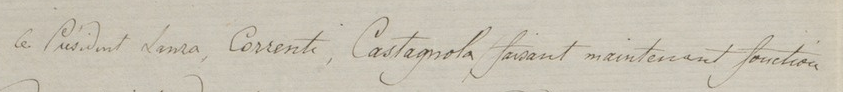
le Président Lanza, Correnti, Castagnola (faisant maintenant fonction
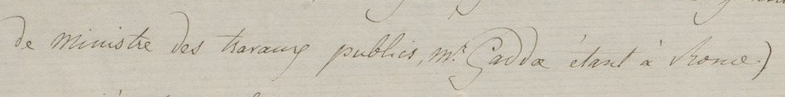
de Ministre des travaux publics, MrGadda étant à Rome.)
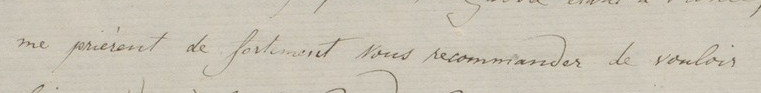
me prièrent de fortement Vous recommander de vouloir
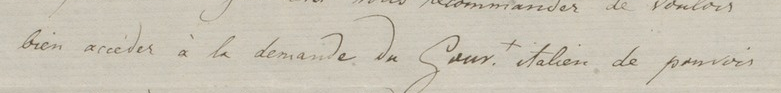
bien accéder à la demande du GouvtItalien de pouvoir
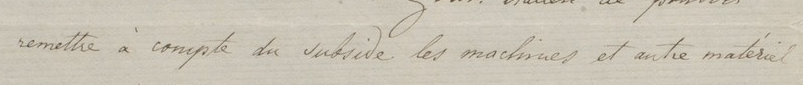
remettre à compte du subside les machines et autre matériel
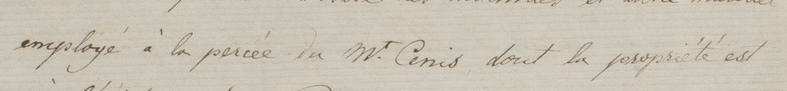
employé à la percée du Mt Cenis, dont la propriété est
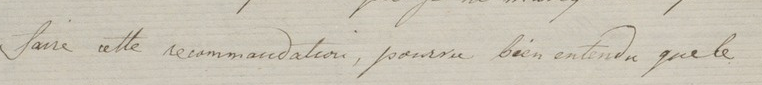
faire cette recommandation, pourvu bien entendu que le
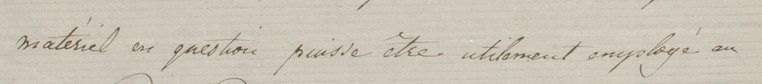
matériel en question puisse être utilement employé au
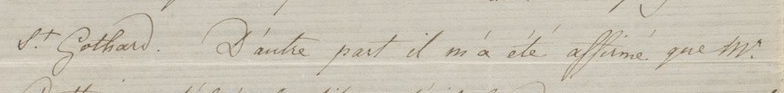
St Gothard. D'autre part il m'a été affirmé que Mr
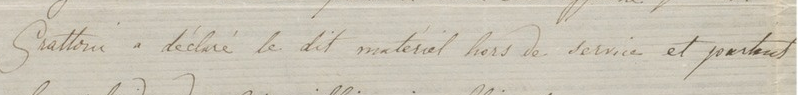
Grattoni a déclaré le dit matériel hors de service et partant
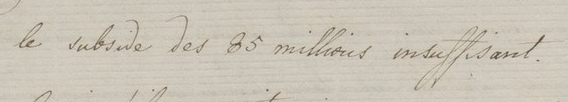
le subside des 85 millions insuffisant.
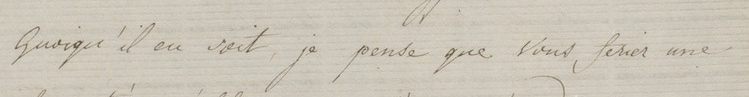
Quoiqu'il en soit, je pense que Vous feriez une
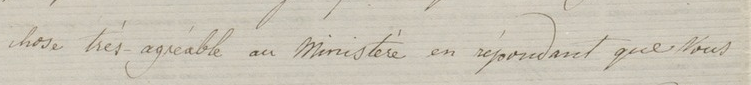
chose très-agréable au Ministère en répondant que Vous
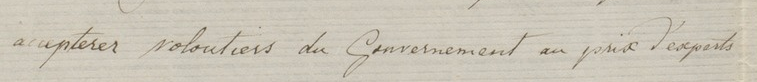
accepterez volontiers du Gouvernement au prix d'experts
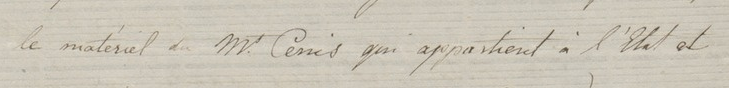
le matériel du Mt Cenis qui appartient à l'Etat et
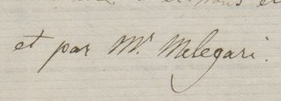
et par MrMelegari.
